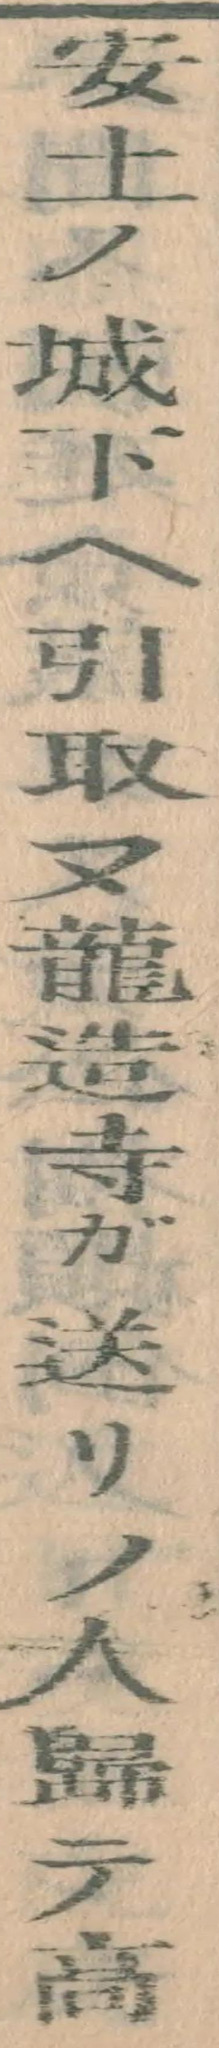安土ノ城下ヘ引取ヌ竜造寺ガ送リノ人帰テ高
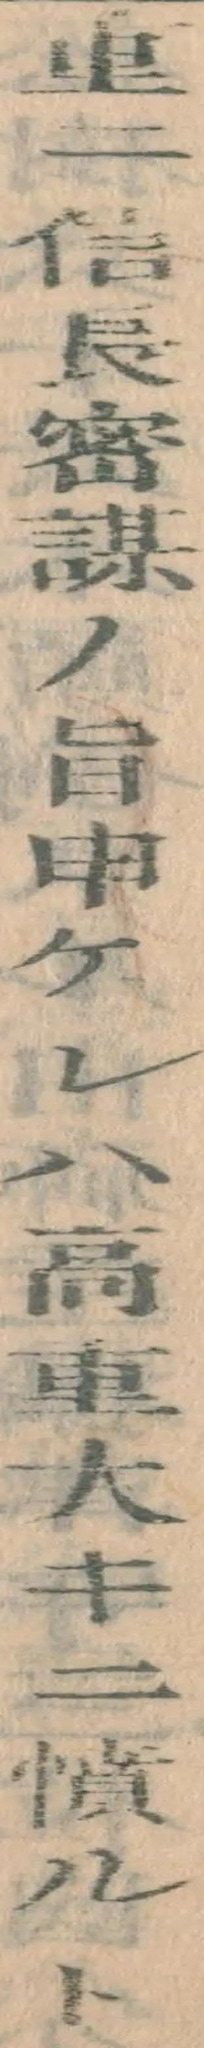重ニ信長密謀ノ旨申ケレハ高重大キニ憤ルト
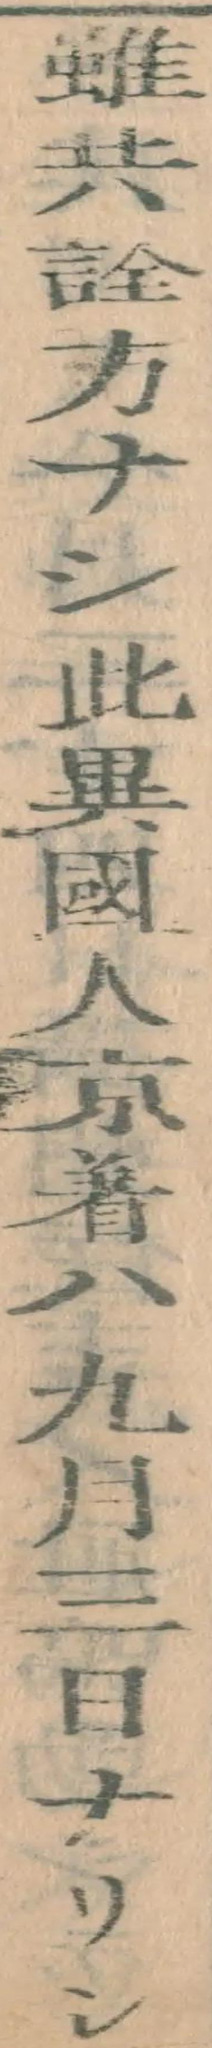雖共詮方ナシ此異国人京着ハ九月三日ナリシ

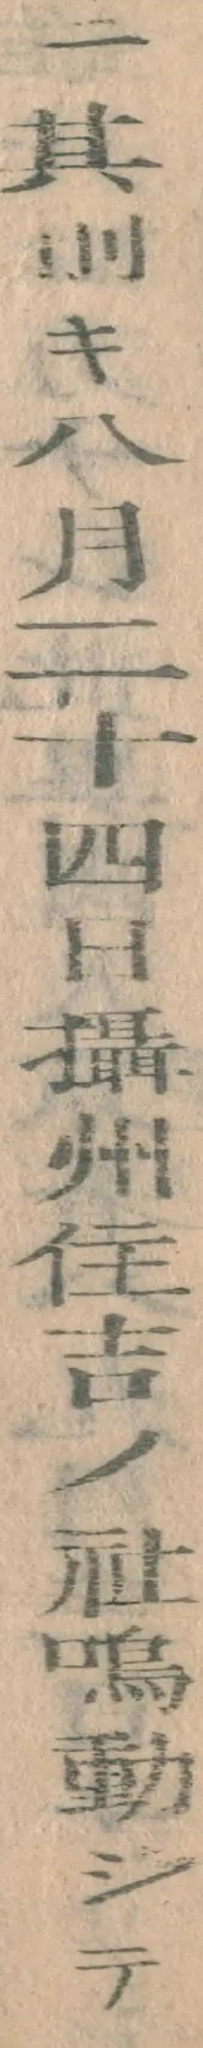ニ其前キ八月二十四日摂州住吉ノ社鳴動シテ
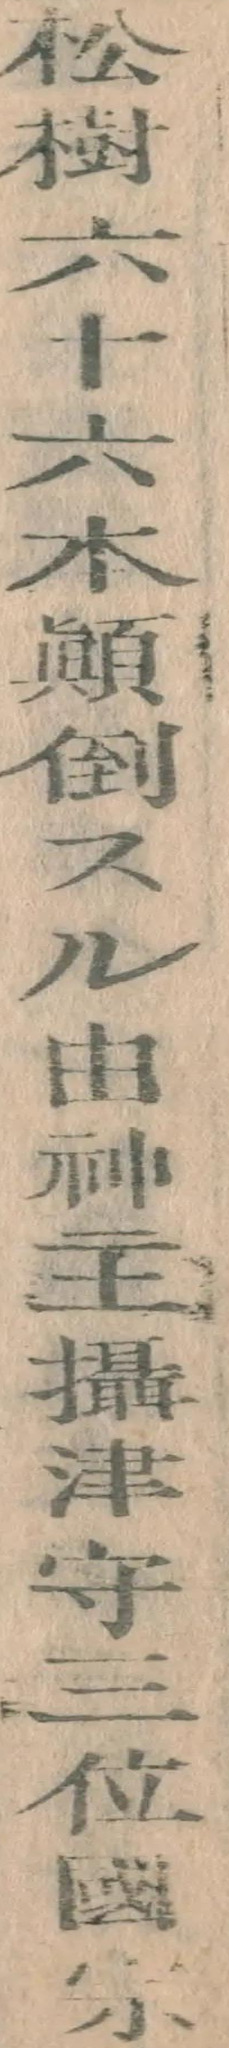松樹六十六本顛倒スル由神主摂津守三位国宗
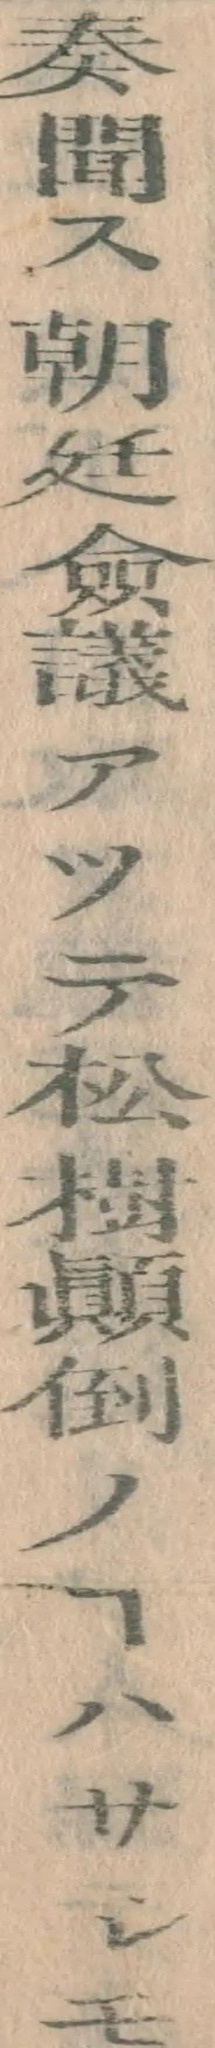奏聞ス朝廷僉議アツテ松樹顛倒ノヿハサシモ
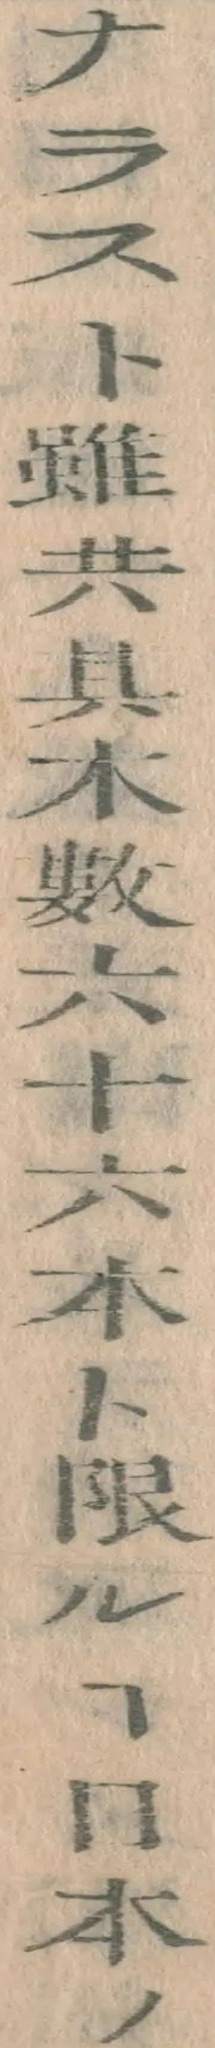ナラスト雖共其木数六十六本ト限ルヿ日本ノ
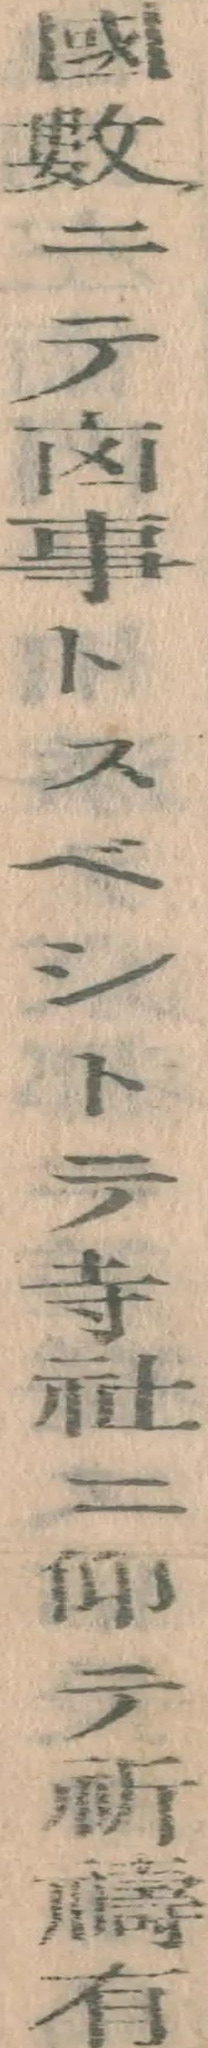国数ニテ㐫事トスベシトテ寺社ニ仰テ祈祷有
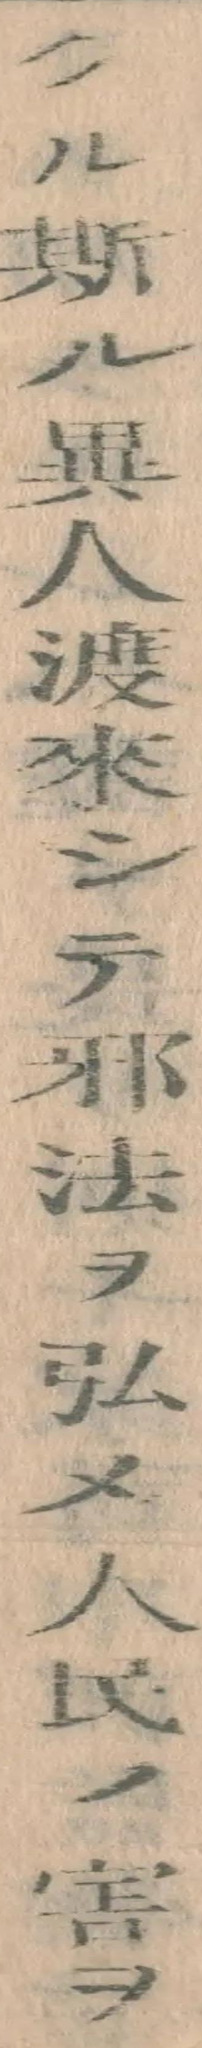クル斯ル異人渡来シテ邪法ヲ弘メ人民ノ害ヲ
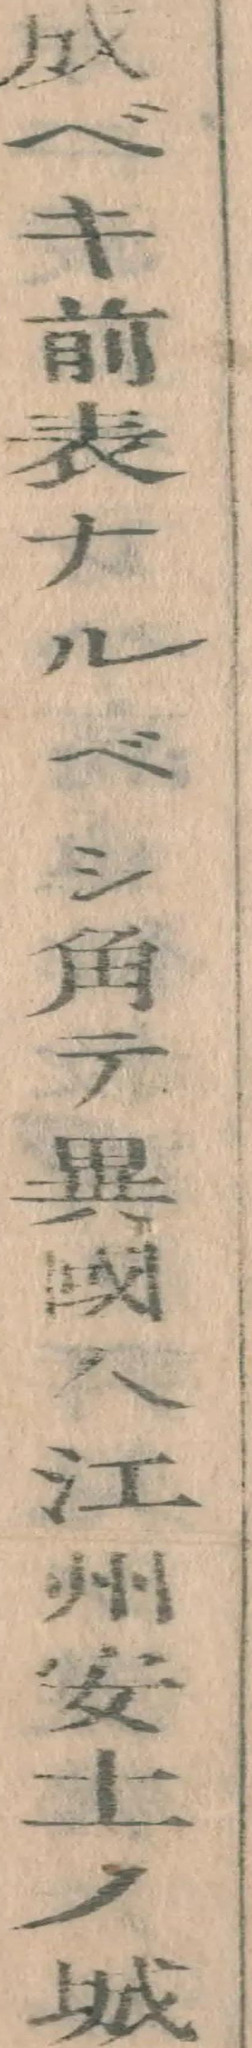成ベキ前表ナルベシ角テ異国人江州安土ノ城
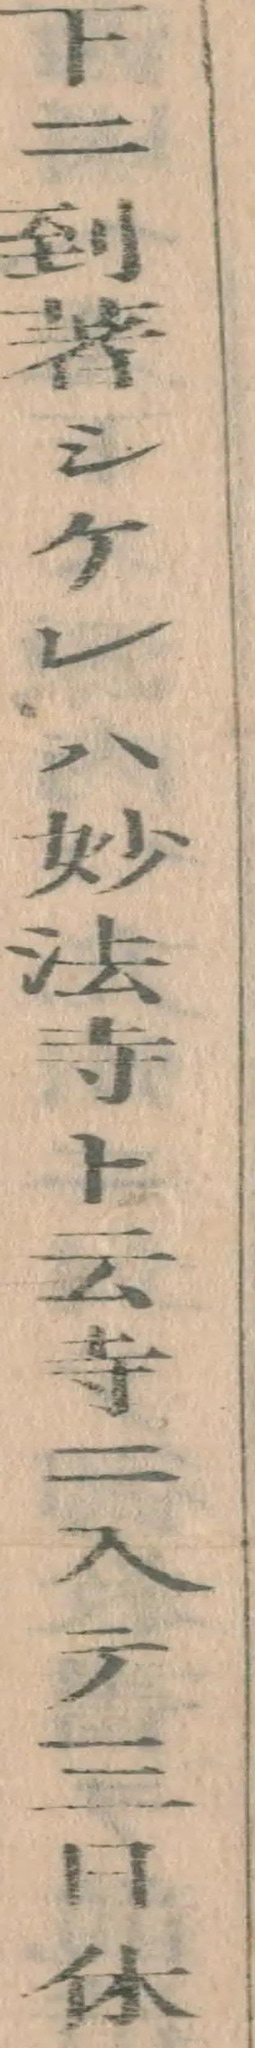下ニ到著シケレハ妙法寺ト云寺ニ入テ三日休
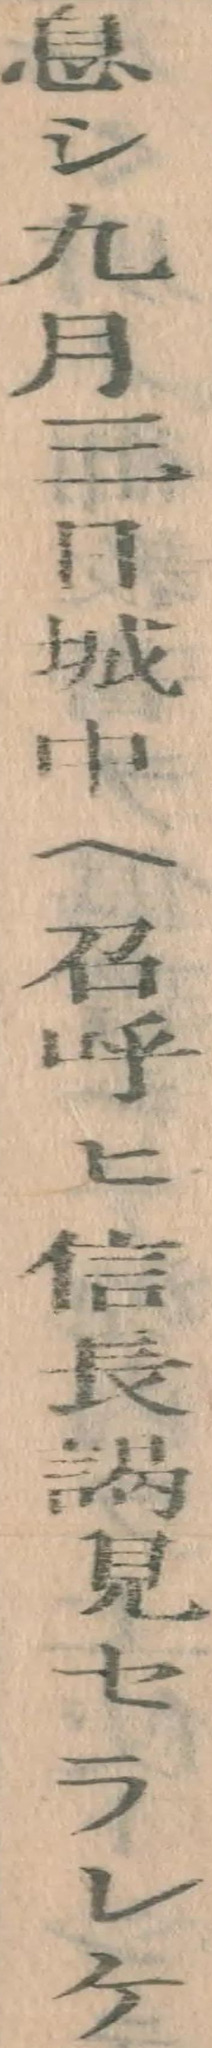息シ九月三日城中ヘ召呼ヒ信長謁見セラレケ
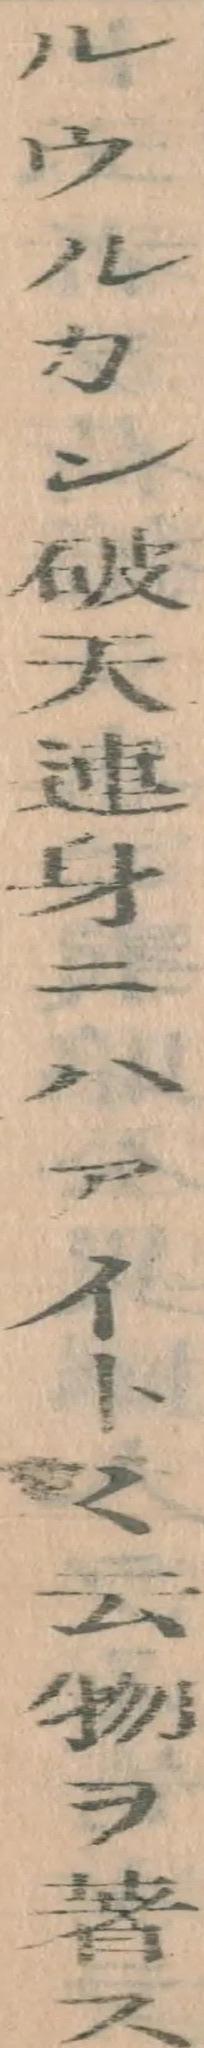ルウルカン破天連身ニハアイト〱云物ヲ著ス
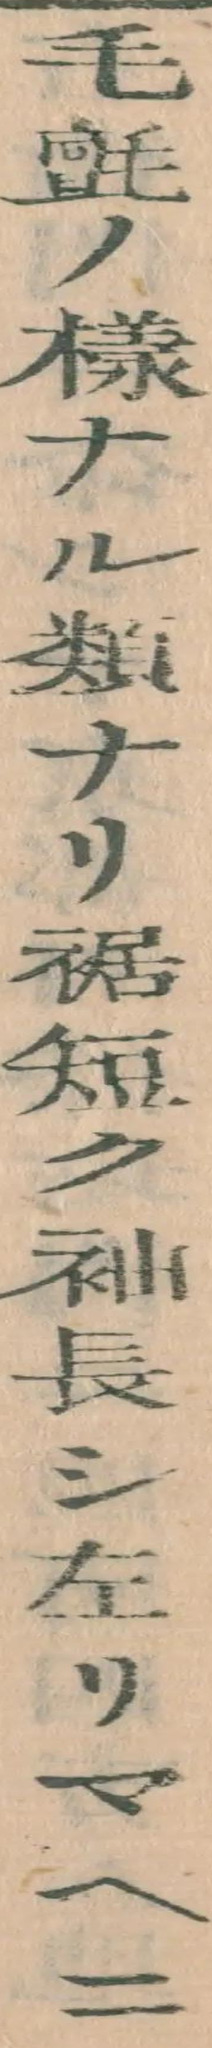毛氈ノ様ナル類ナリ裾短ク袖長シ左リマヘニ
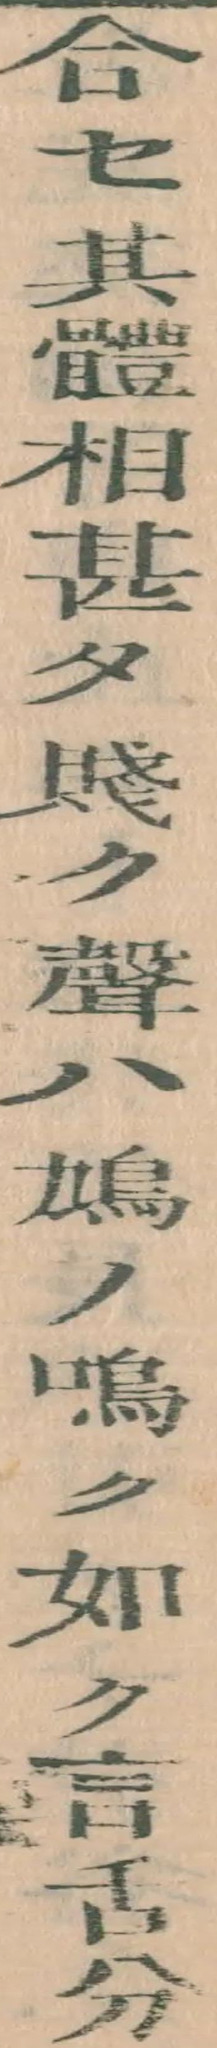合セ其体相甚タ賤ク声ハ鳩ノ鳴ク如ク言舌分
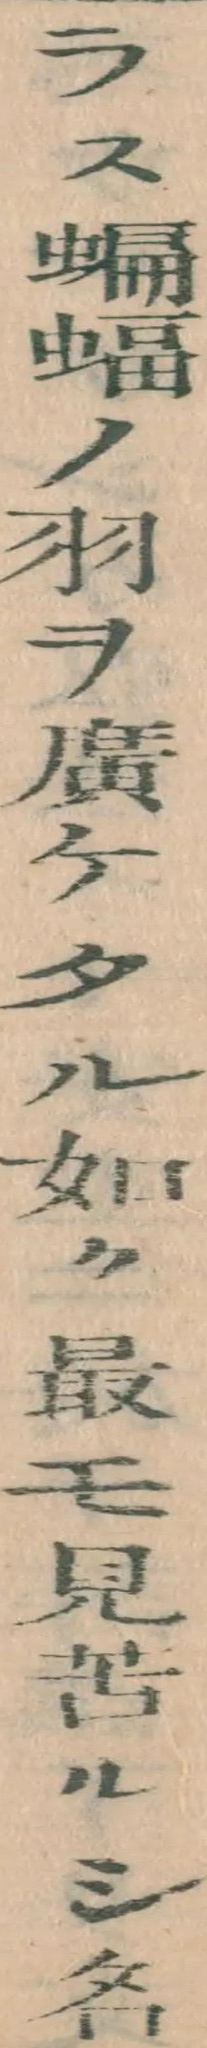ラス蝙蝠ノ羽ヲ広ケタル如ク最モ見苦ルシ名
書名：南蛮寺興廃記
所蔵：国立国会図書館 National Diet Library, JAPAN
